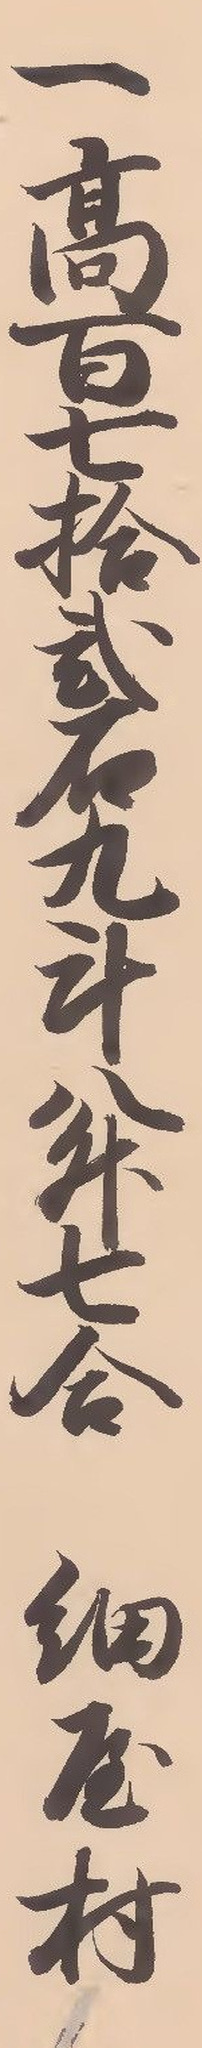一高百七拾弐石九斗八升七合細屋村
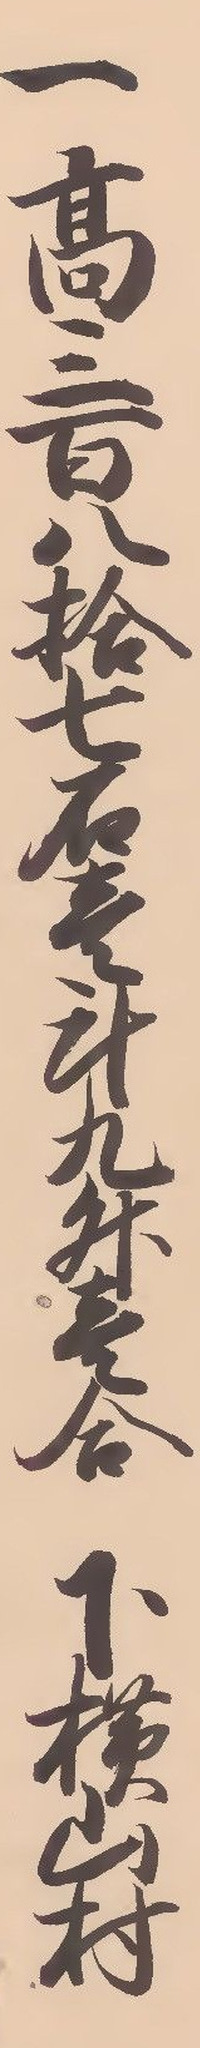一高三百八拾七石壱斗九升壱合下横山村

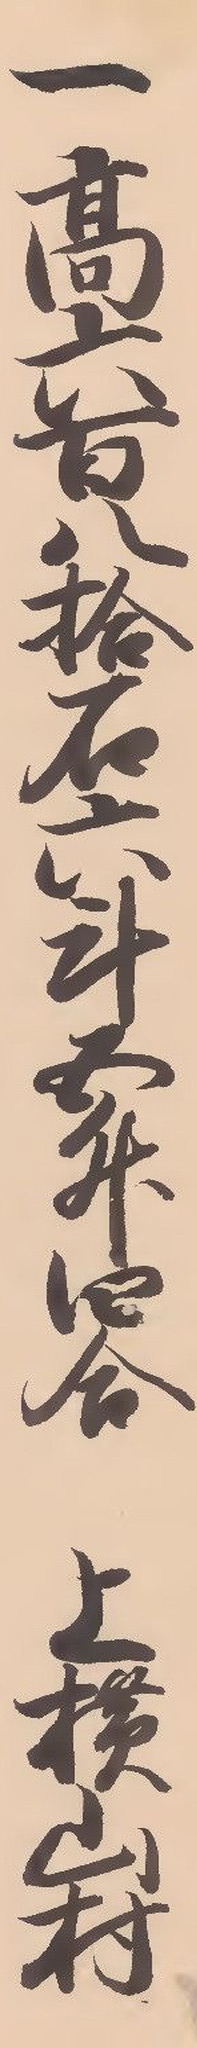一高六百八拾石六斗五升四合上横山村
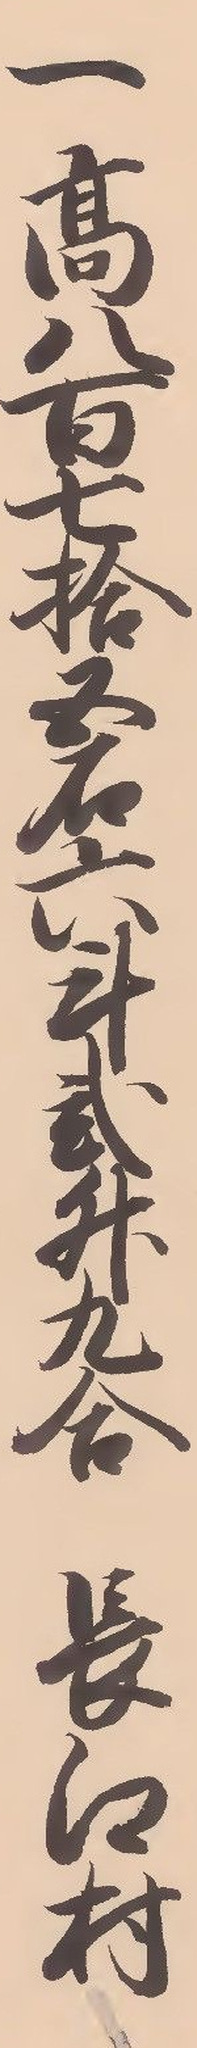一高八百七拾五石六斗弐升九合長江村
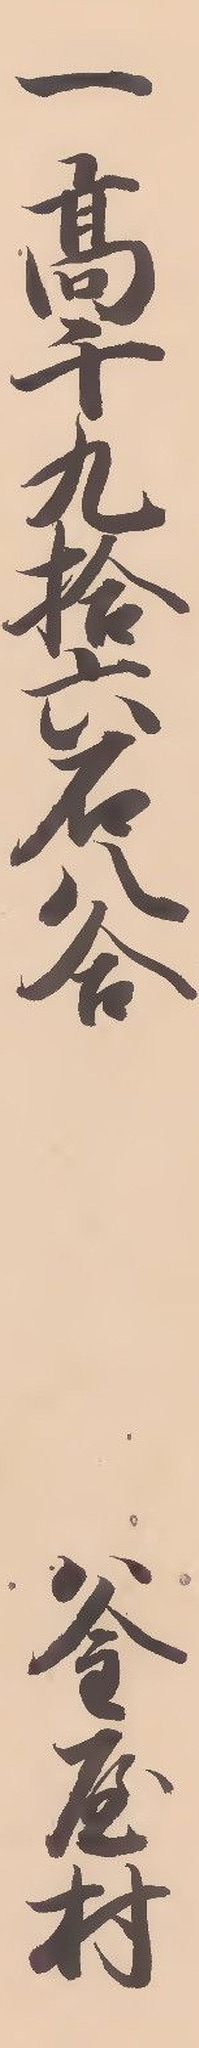一高千九拾六石八合釜屋村
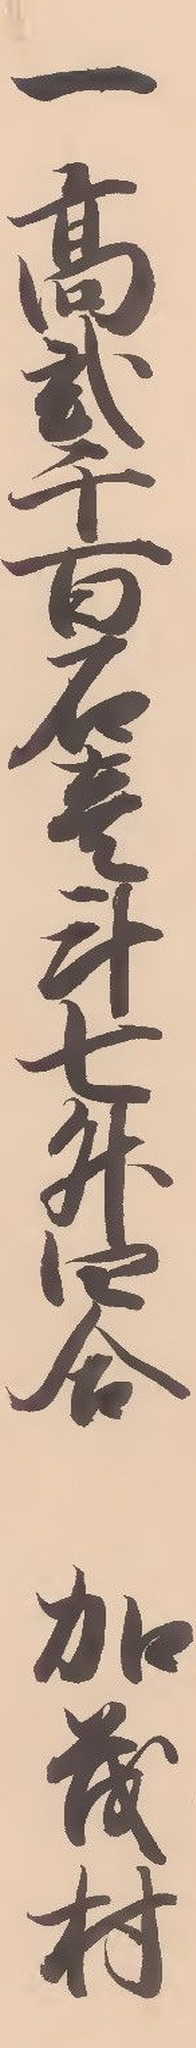一高弐千百石壱斗七升四合加茂村
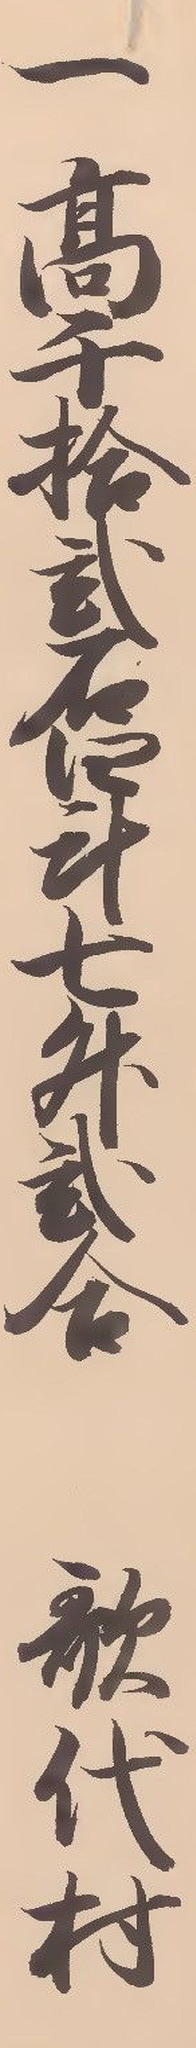一高千拾弐石四斗七升弐合歌代村
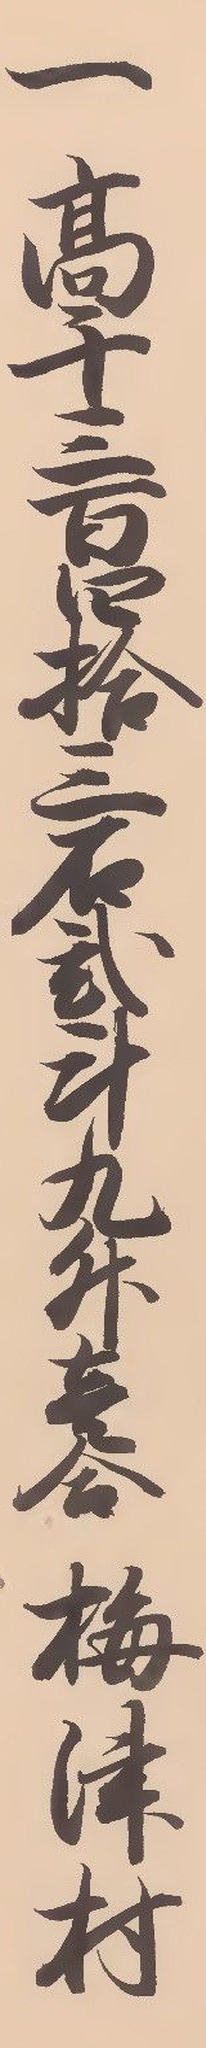一高千三百四拾三石弐斗九升壱合梅津村
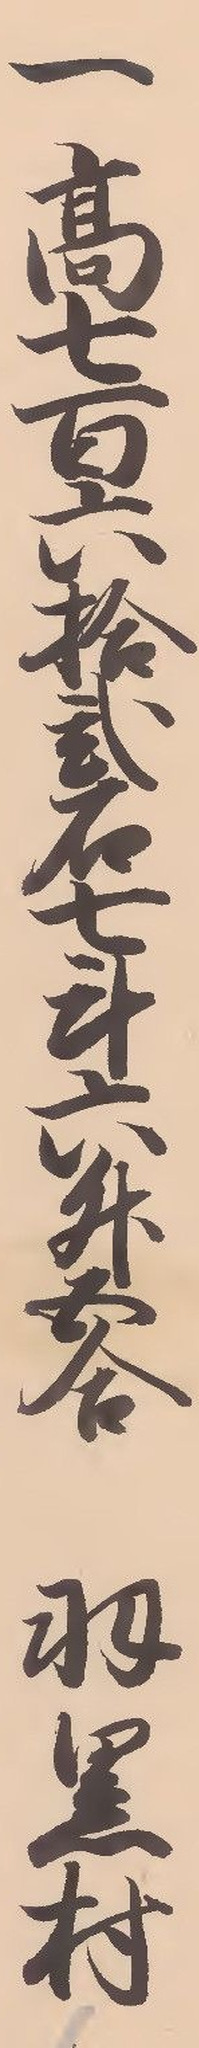一高七百六拾弐石七斗六升五合羽黒村
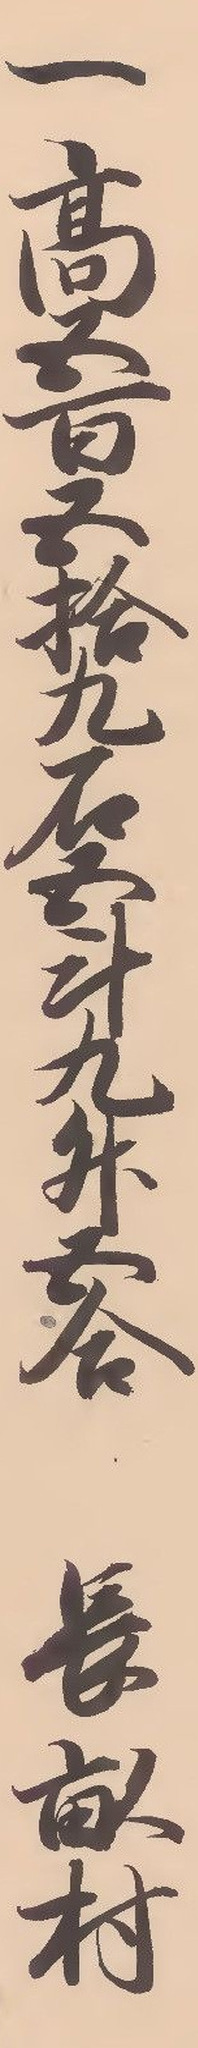一高五百五拾九石五斗九升五合長畝村

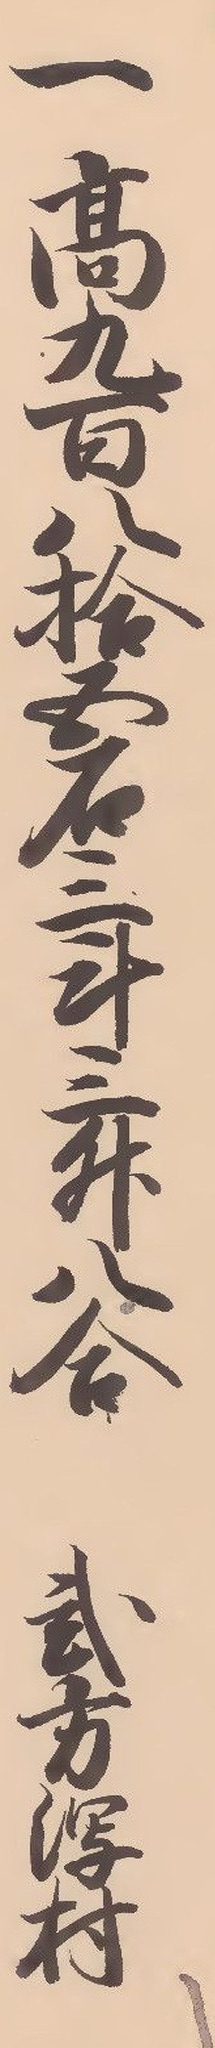一高九百八拾五石三斗三升八合武方潟村
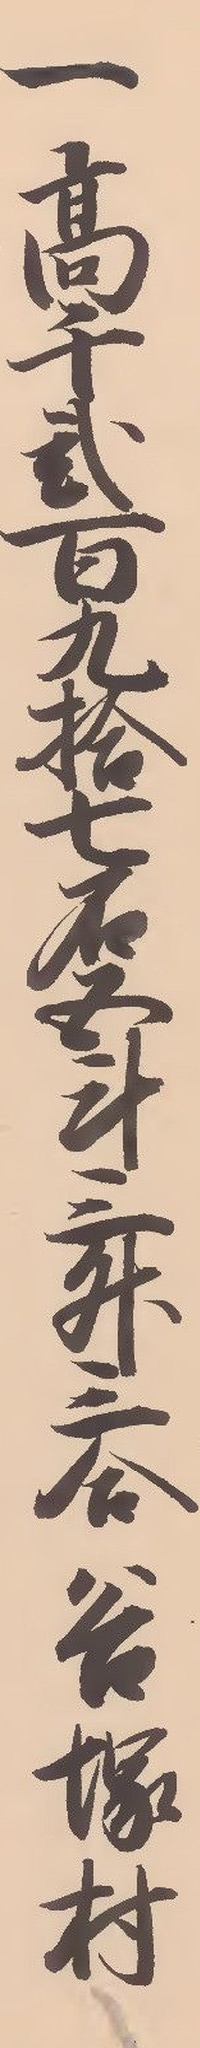一高千弐百九拾七石五斗三升三合谷塚村
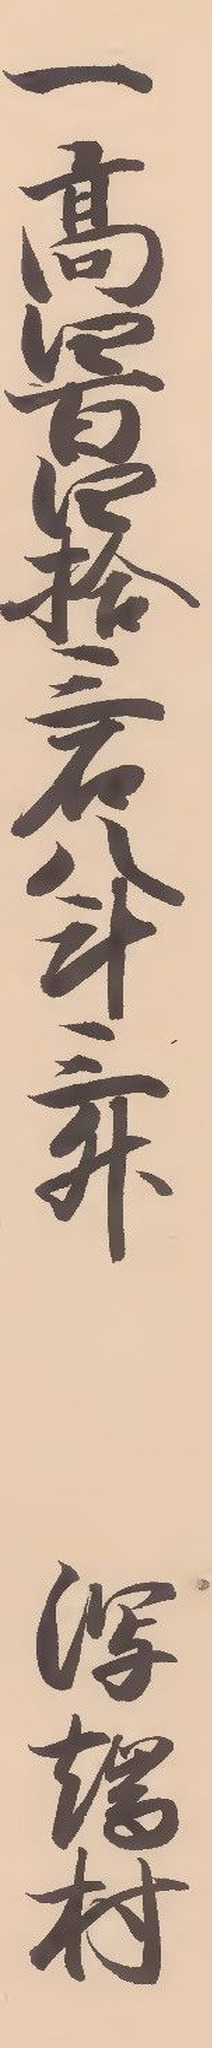一高四百四拾三石八斗三升潟端村
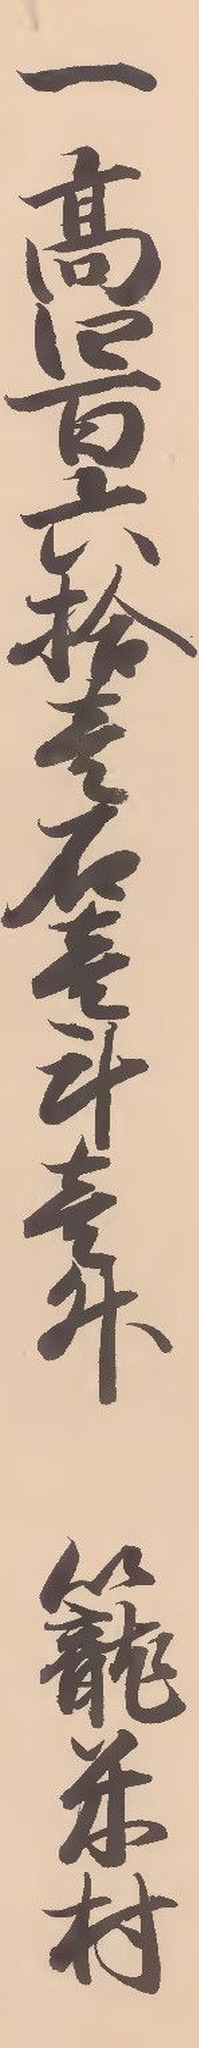一高四百六拾壱石壱斗壱升籠米村
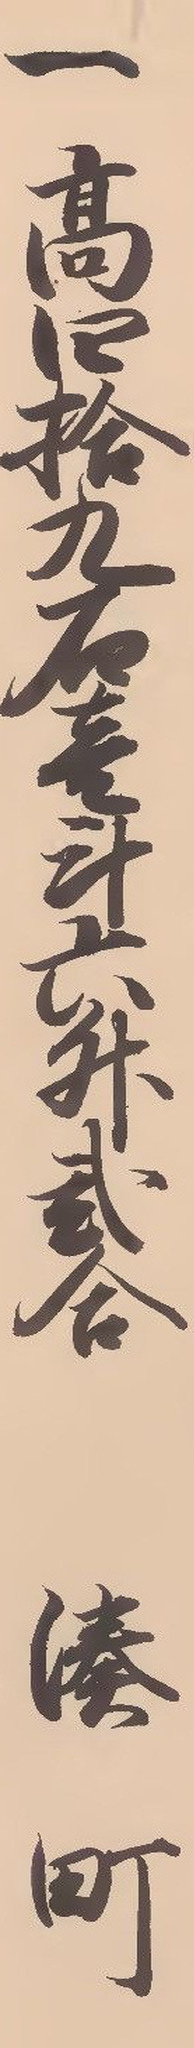一高四拾九石壱斗六升弐合湊町
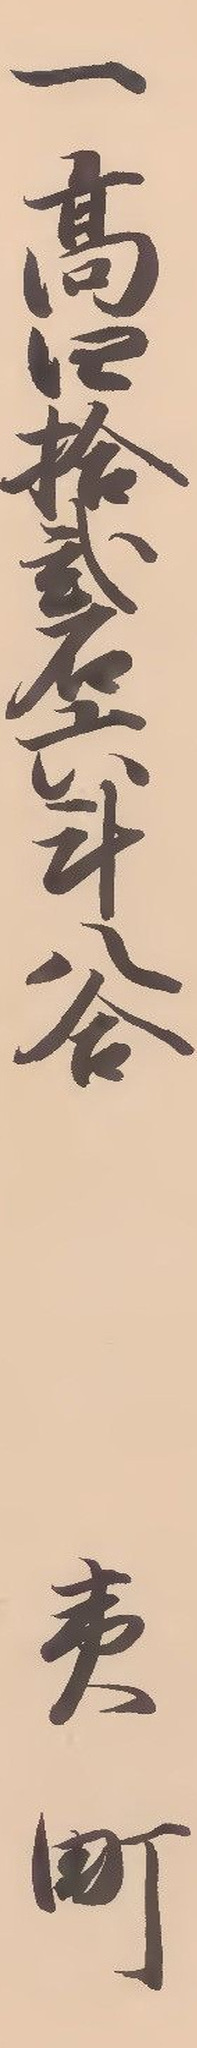一高四拾弐石六斗八合夷町
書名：佐渡国郷帳
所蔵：国立公文書館 National Archives of Japan
